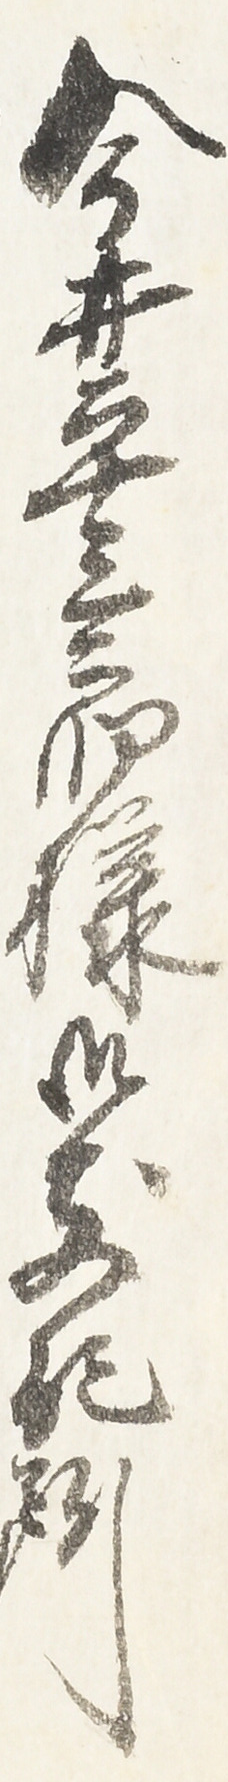今井平三郎様御支配所
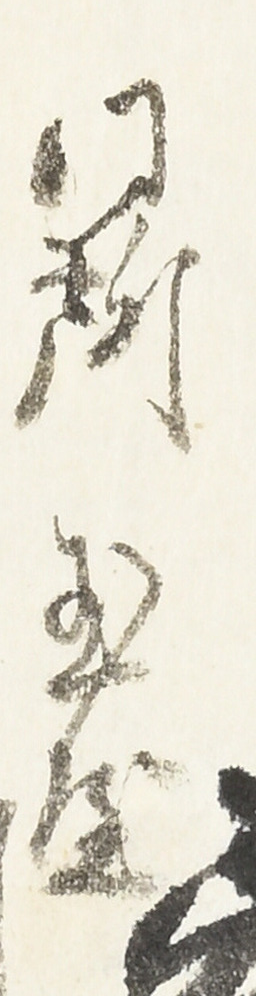同所玉屋
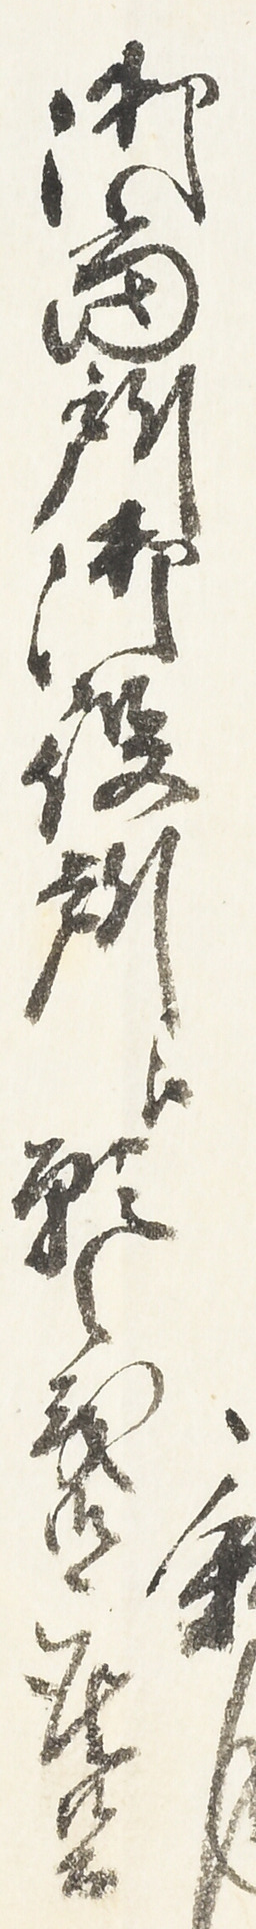御当所御役所江願之義御座候而
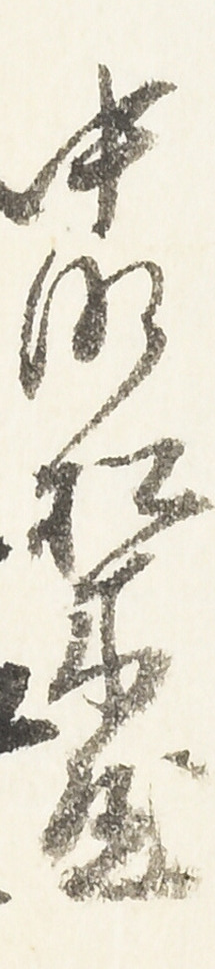中町松木屋
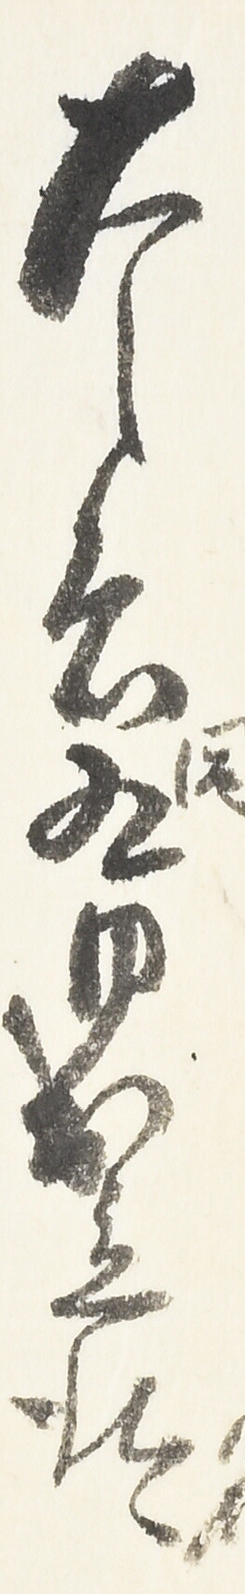右之者九日出立仕候
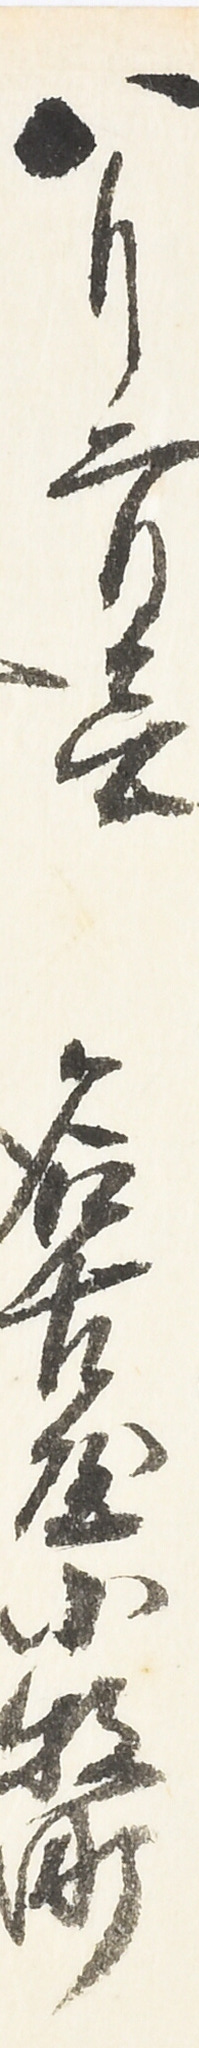八月二日着名古屋小牧町
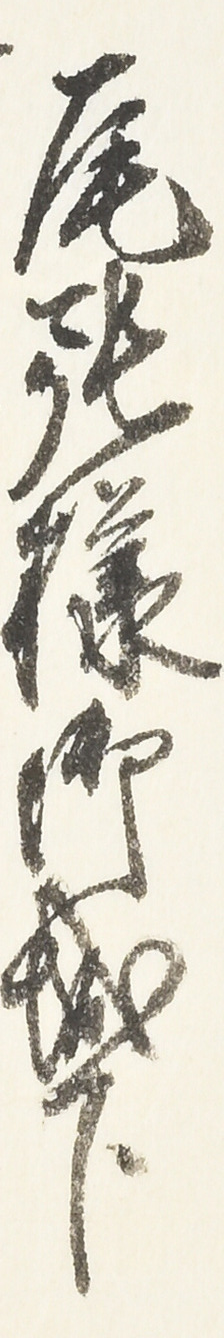尾張様御城下
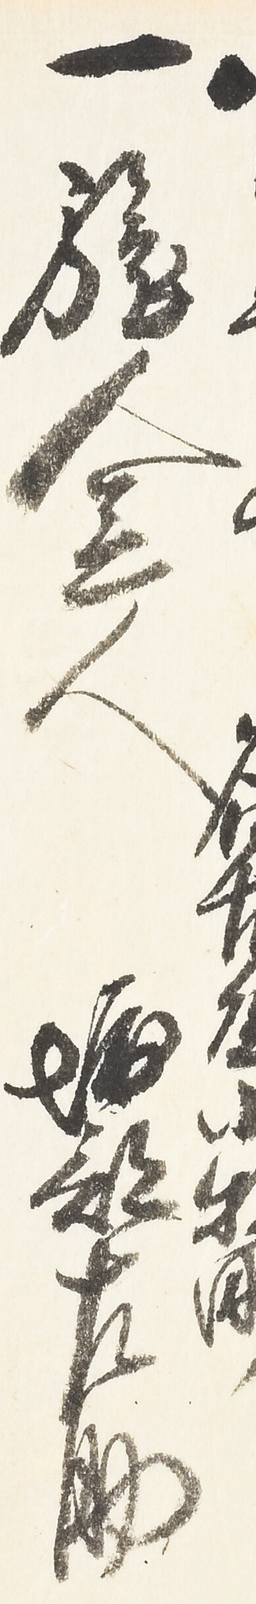一旅人壱人堀部左助
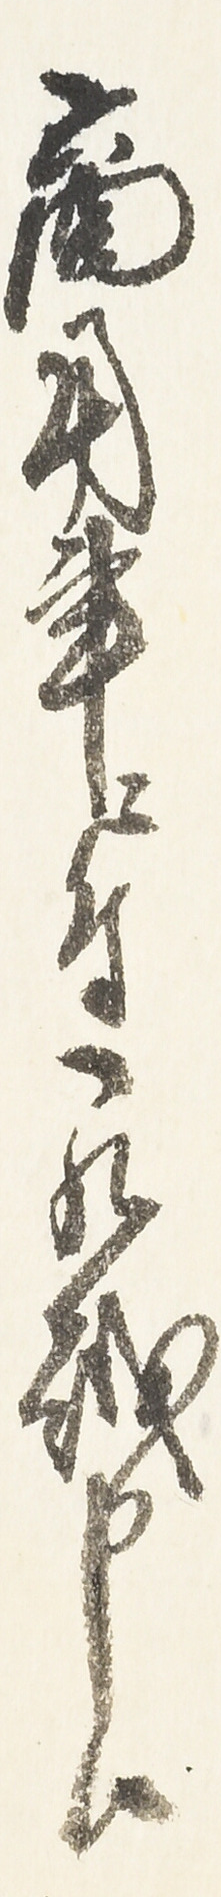商用事ニ付罷越申候
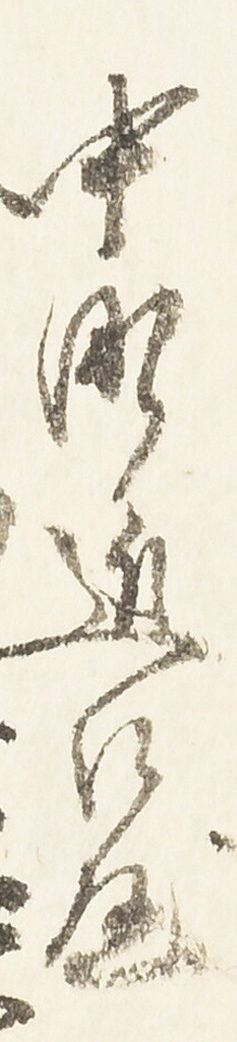中町近江屋
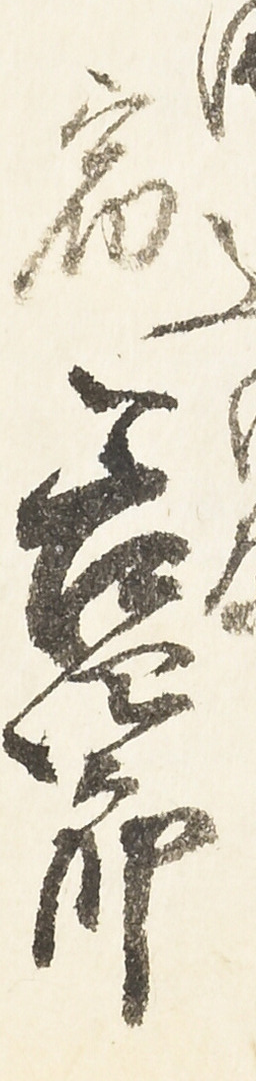宿善四郎
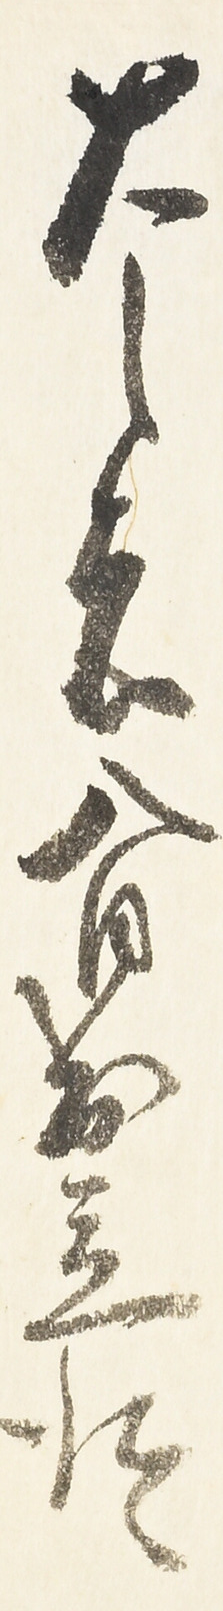右之者八日出立仕候
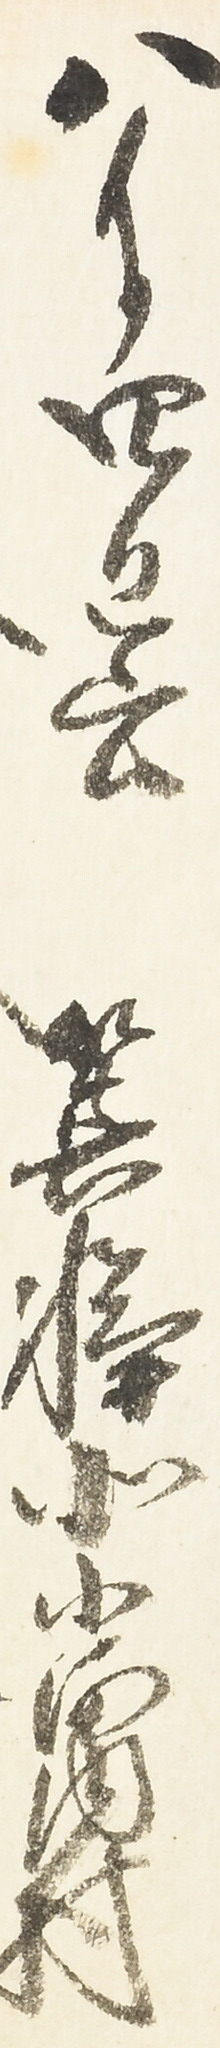八月四日着箕輪北小河内村
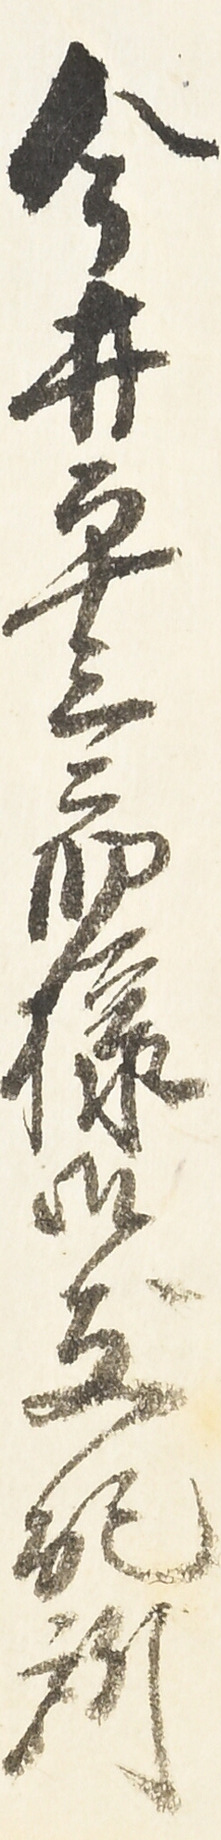今井平三郎様御支配所
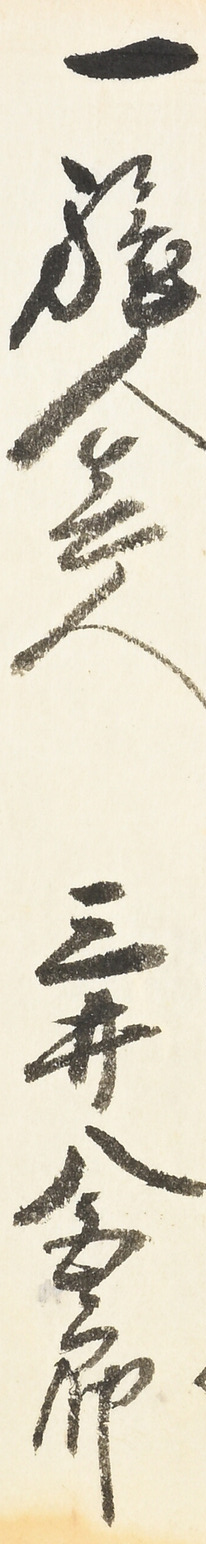一旅人壱人三井八五郎
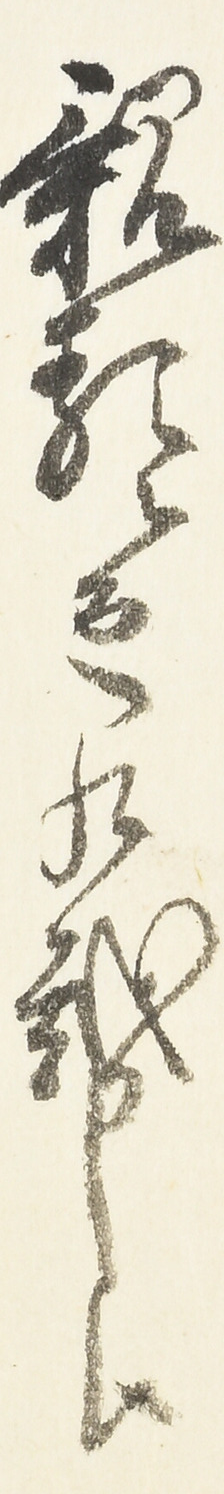親類ニ而罷越申候
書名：町中旅人泊控帳
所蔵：伊那市立高遠町図書館・合同会社AMANE
